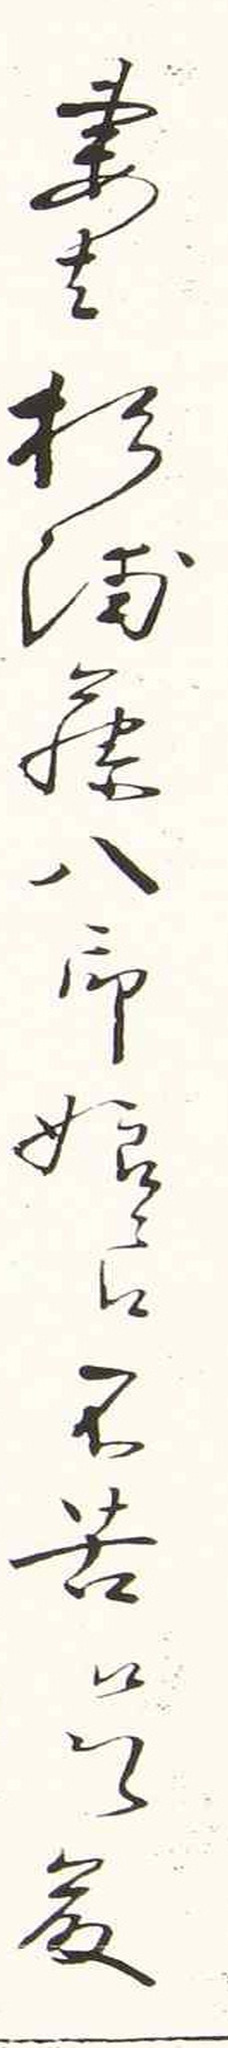妻者杉浦藤八郎娘ニ而不苦候ハヽ藤
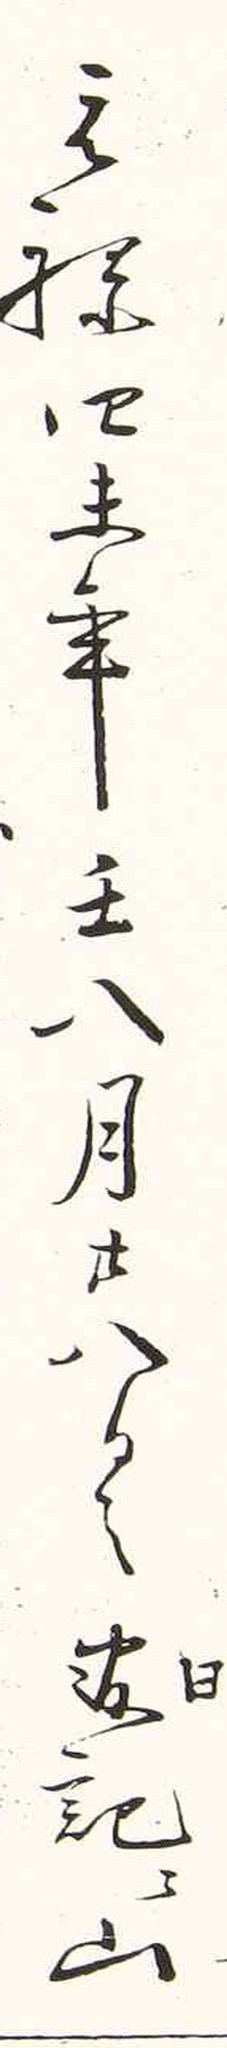元禄四未年壬八月廿八日之官記ニ山
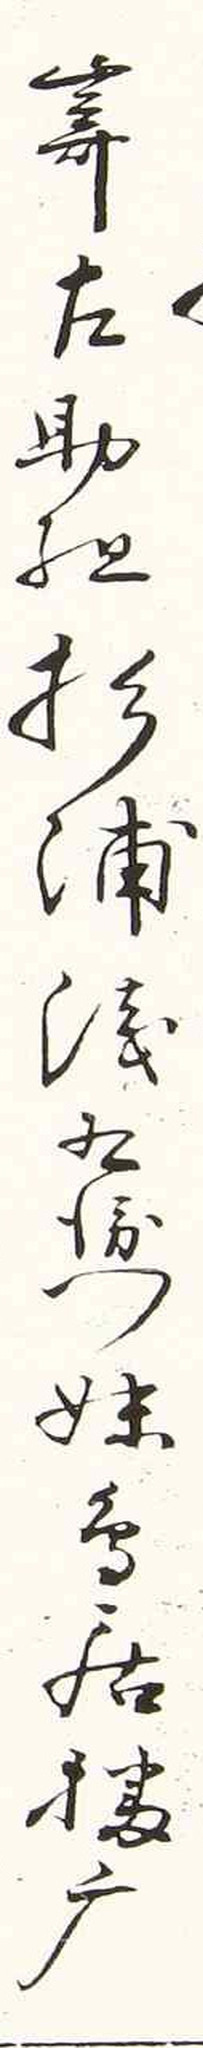崎左助組杉浦浅左衛門妹鳥居播广
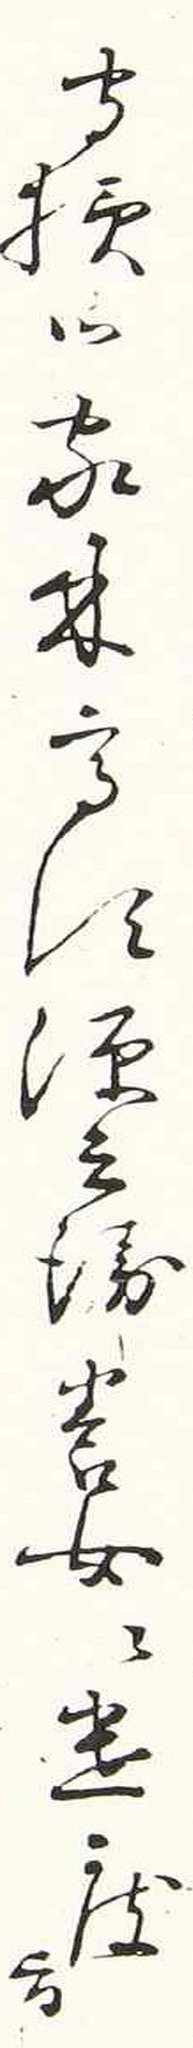守様御家来高須源兵衛養女ニ遣度旨
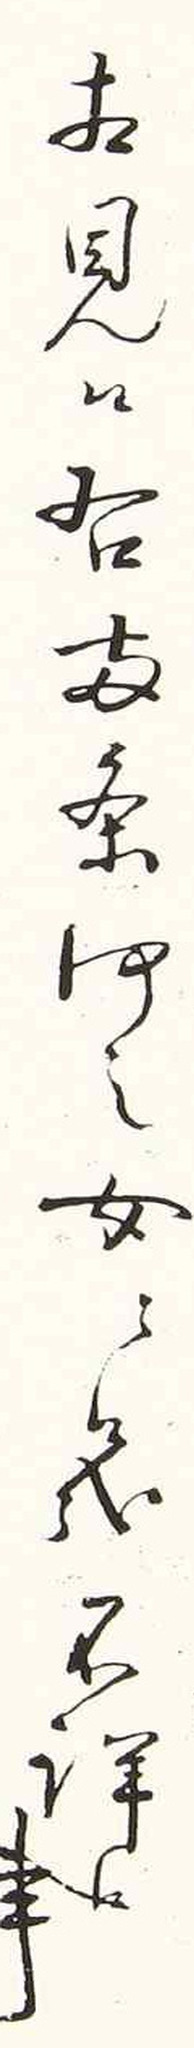相見候右両条何之女ニ候哉不詳候事
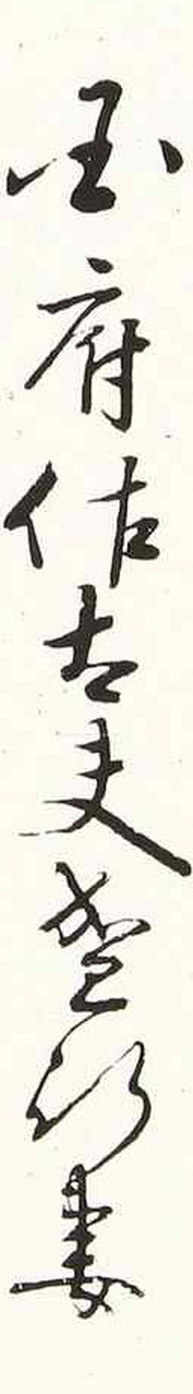女国府佐太夫盛行妻
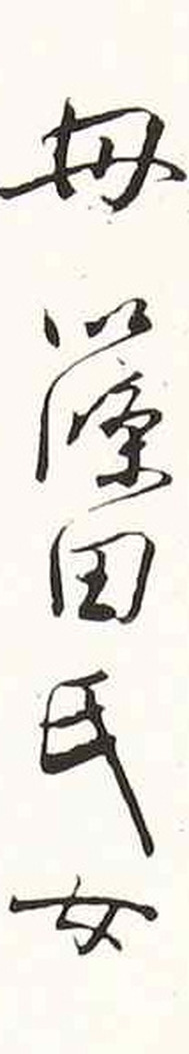母篠田氏女
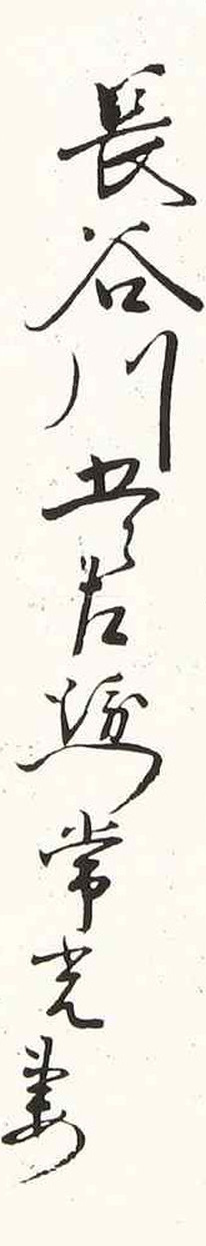女長谷川五郎左衛門常光妻
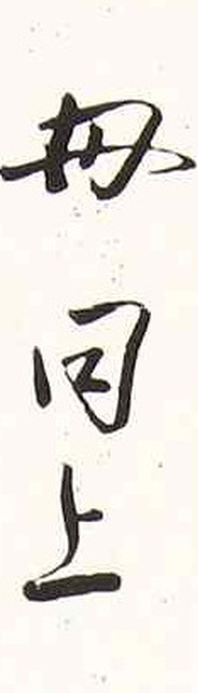母同上
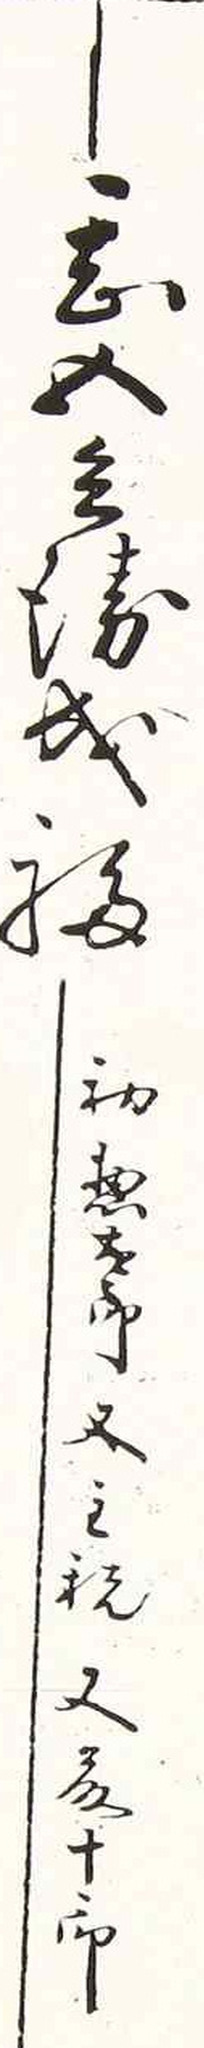甚五兵衛成福初惣太郎又主税又藤十郎
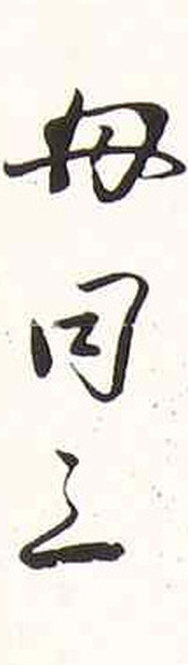母同上
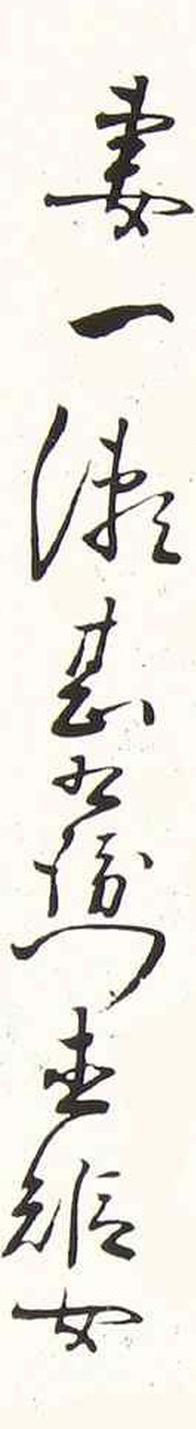妻一瀬甚左衛門直矩女
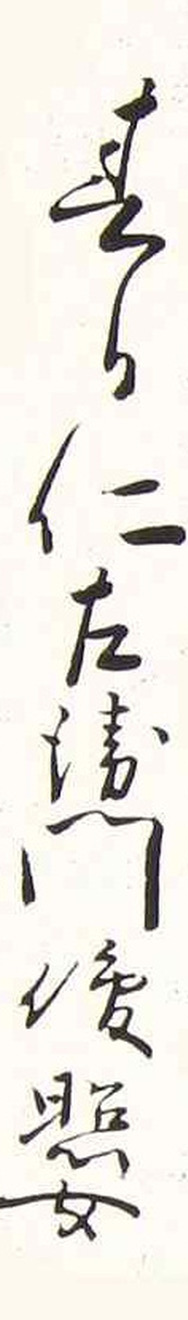春日仁左衛門俊照女
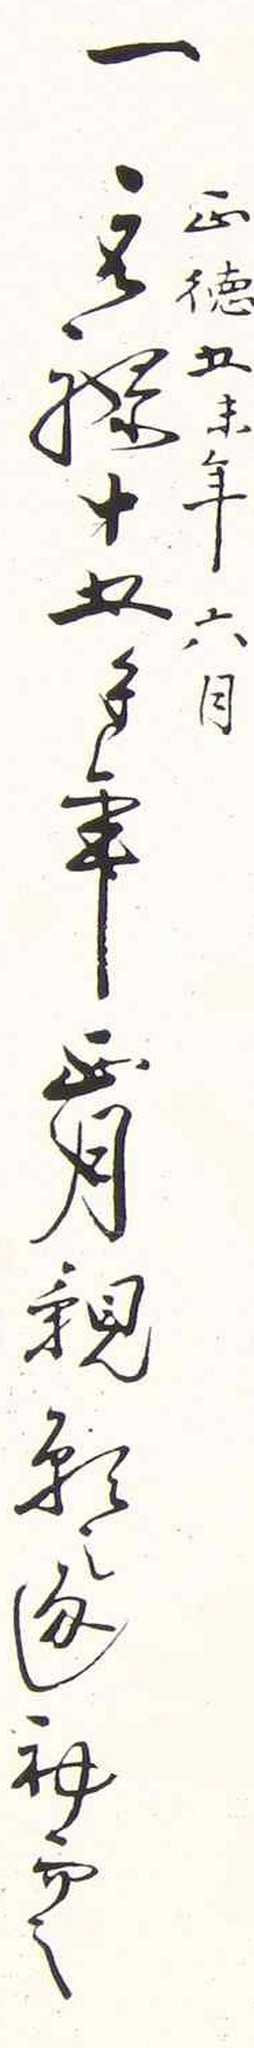一元禄十五午年正月親願之通初而之

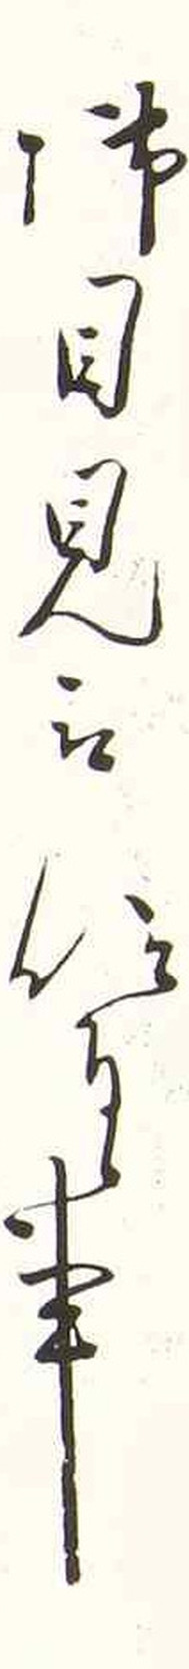御目見被仰付候事
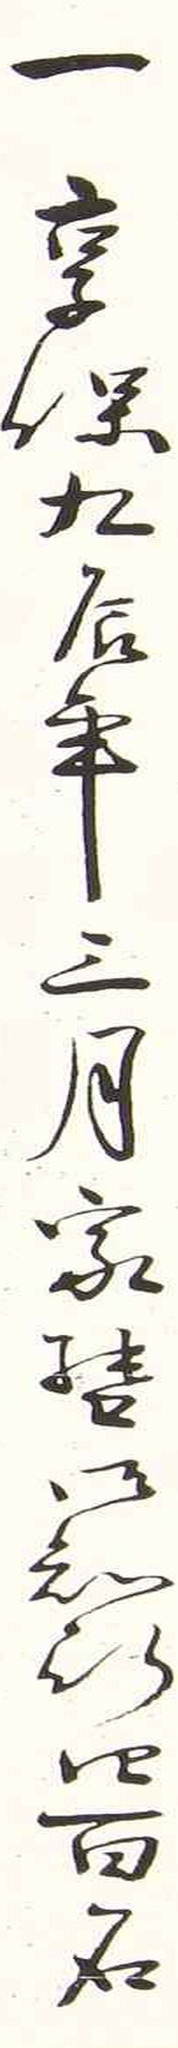一享保九辰年三月家督御知行四百石
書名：諸士系譜　巻之357　す之部7
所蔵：会津若松市立会津図書館
